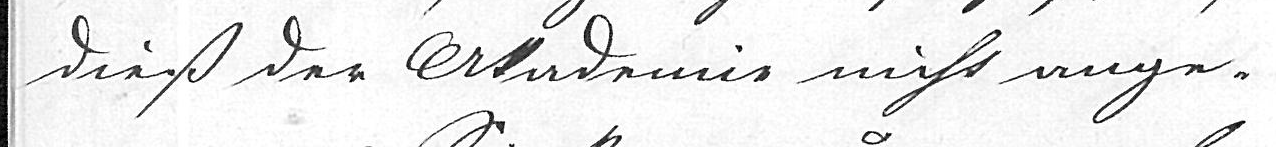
dieß der Akademie nicht ange-
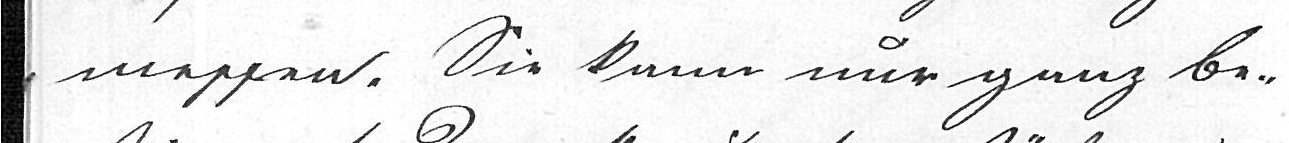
messen. Sie kann nur ganz be-
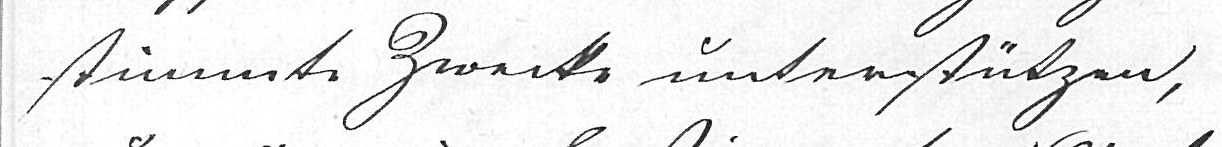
stimmte Zwecke unterstützen,
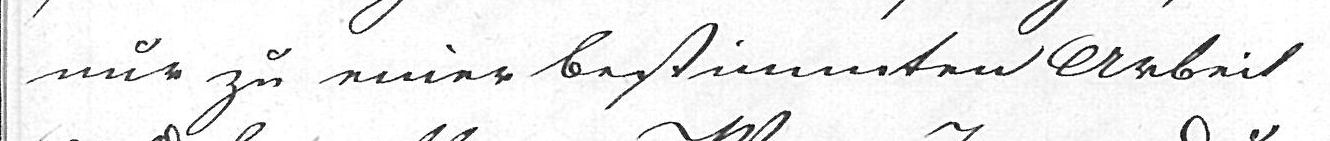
nur zu einer bestimmten Arbeit
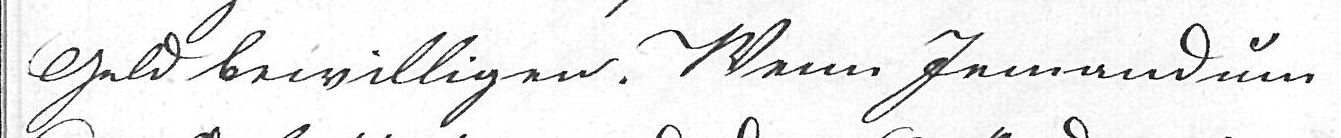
Geld bewilligen. Wenn Jemand um
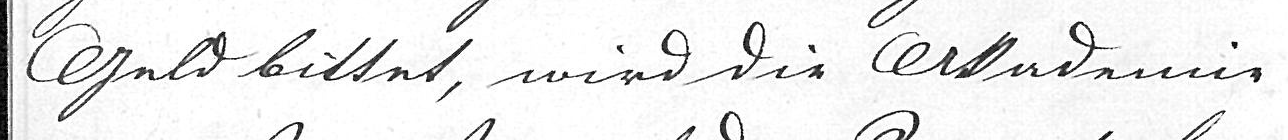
Geld bittet, wird die Akademie
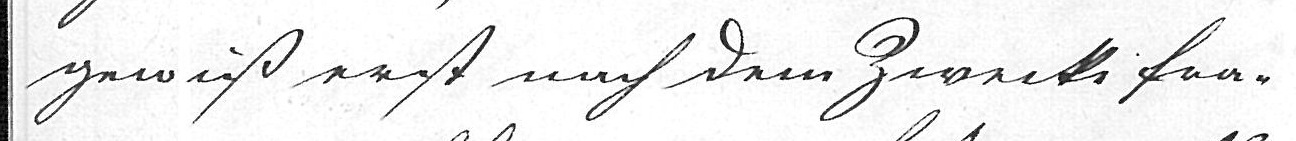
gewiß erst nach dem Zwecke fra-
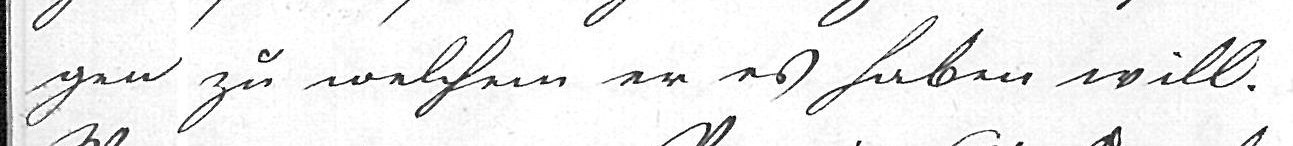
gen zu welchem er es haben will.
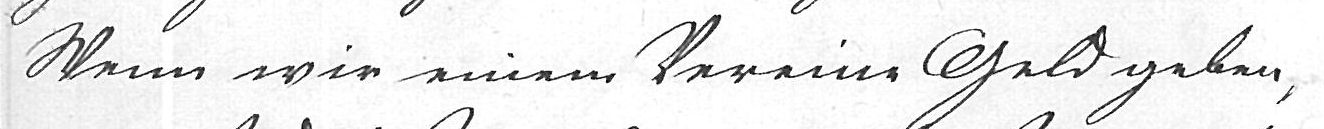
Wenn wir einem Vereine Geld geben,
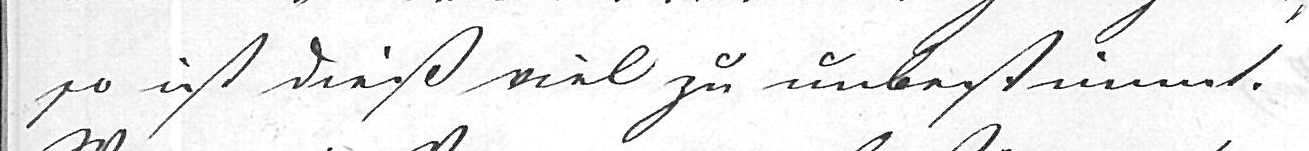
so ist dieß viel zu unbestimmt.
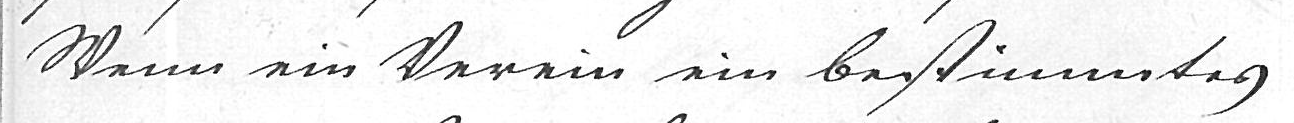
Wenn ein Verein ein bestimmtes
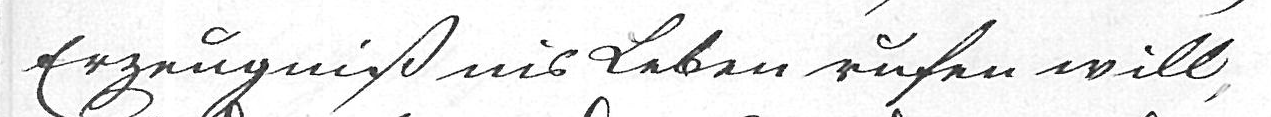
Erzeugniß ins Leben ruden will
